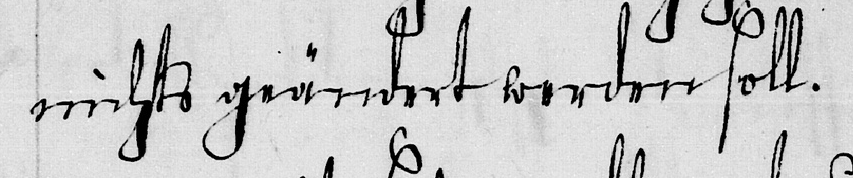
nichts geändert werden soll.
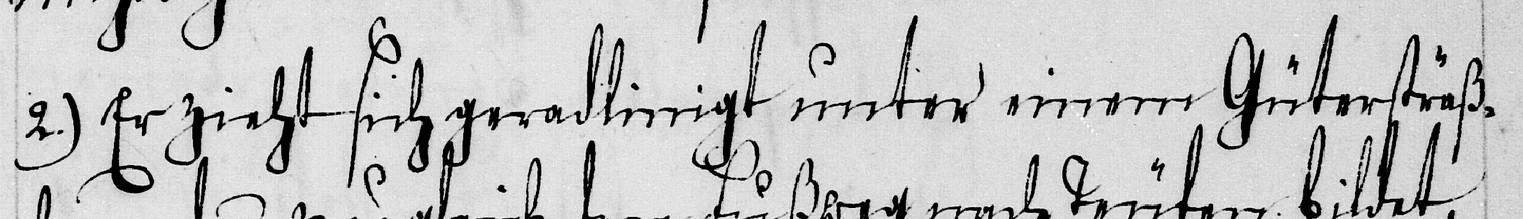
2.) Er zieht sich geradlinigt unter einem Gütersträß¬
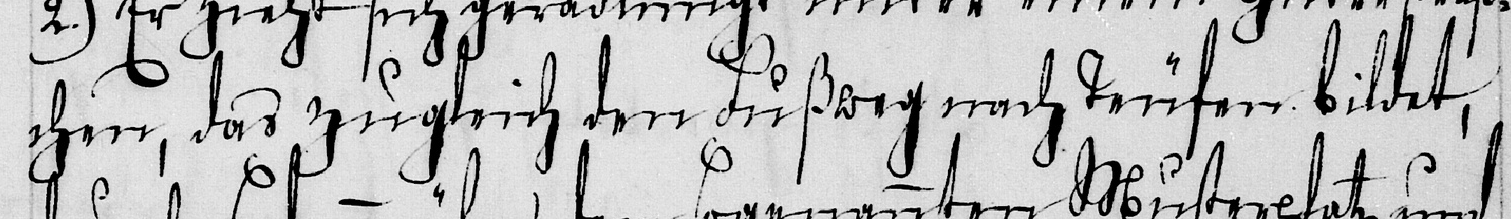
chen, das zugleich den Fußweg nach Teufen bildet,
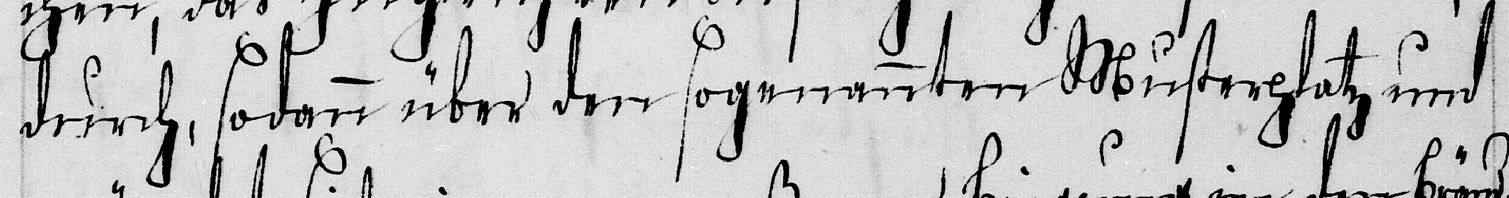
durch, sodann über den sogenannten Musterplatz und
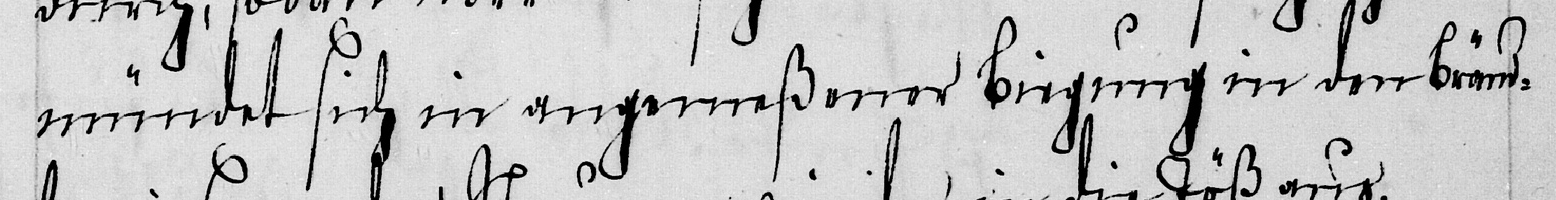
mündet sich in angemeßener Biegung in den Bränd¬
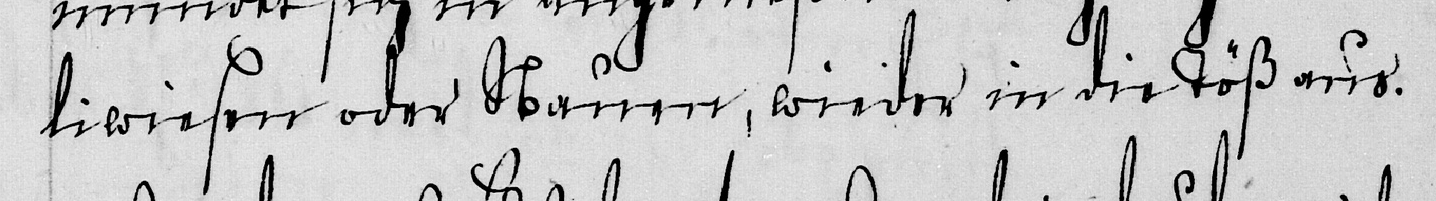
liwiesen oder Nauen, wieder in die Töß aus.
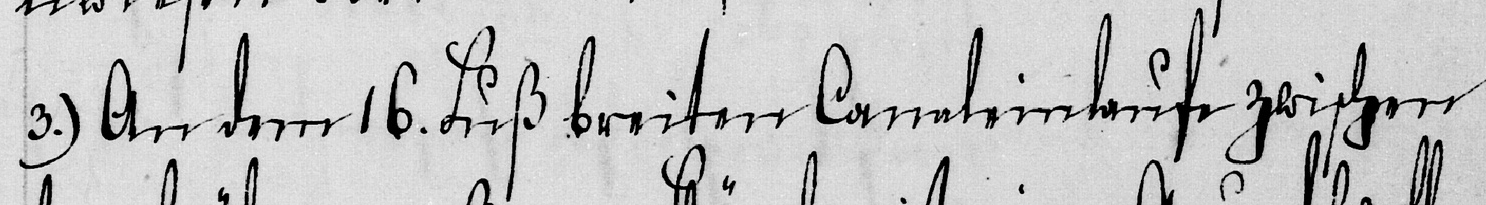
3.) An dem 16. Fuß breiten Canaleinlaufe zwischen
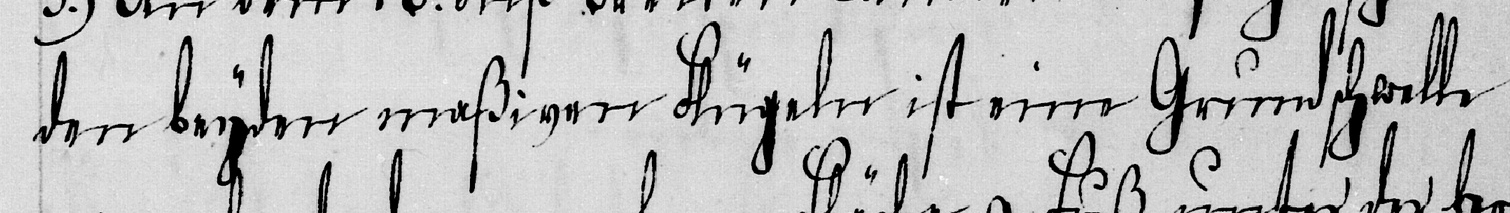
den beyden maßiven Flügeln ist eine Grundschwelle
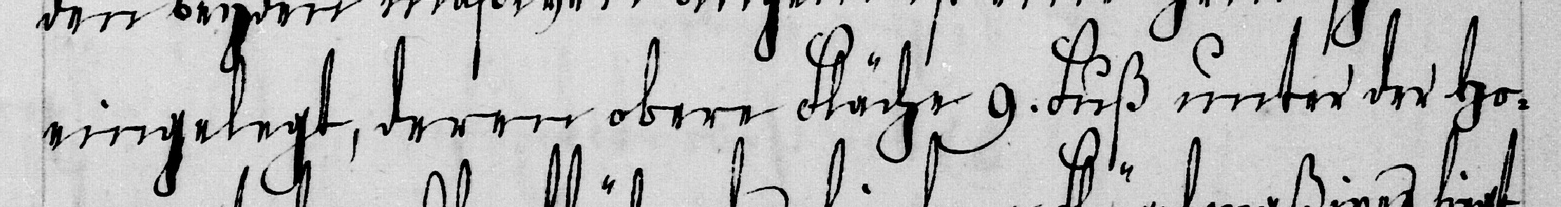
eingelegt, deren obere Fläche 9. Fuß unter der ho¬
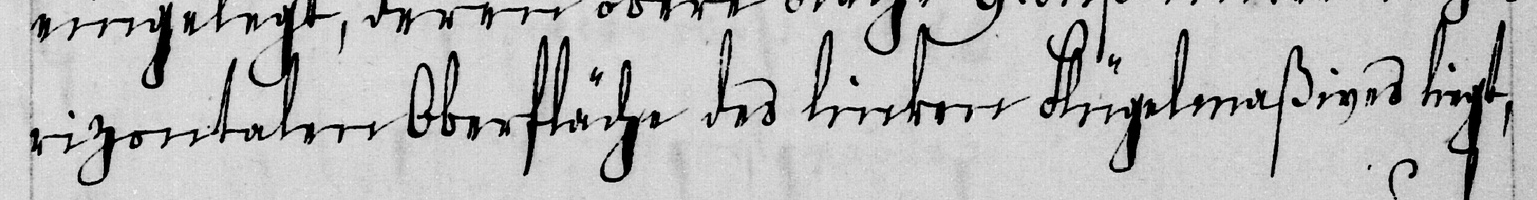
rizontalen Oberfläche des linken Flügelmaßives lie¬
